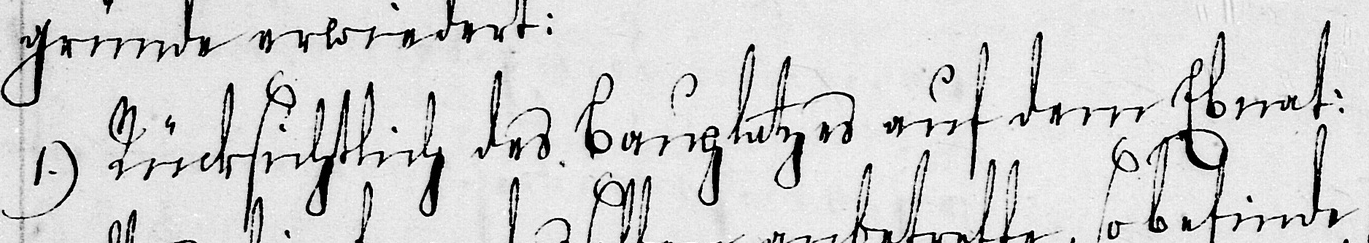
1.)Rücksichtlich des Bauplatzes auf dem Ebnat:
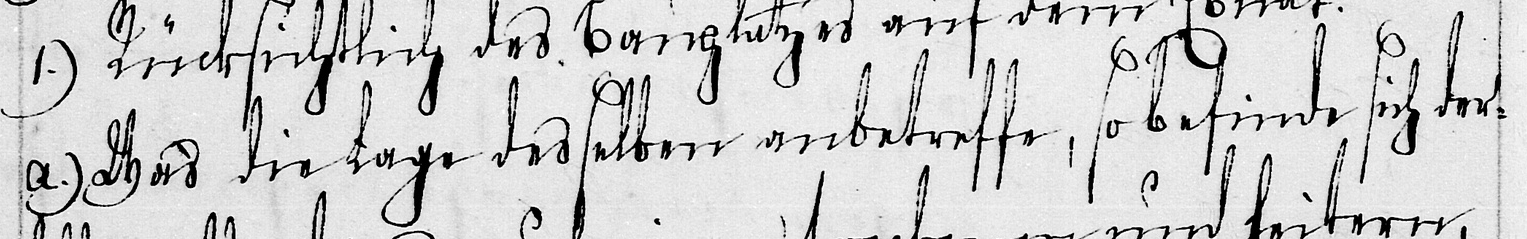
a.) Was die Lage desselben anbetreffe, so befinde
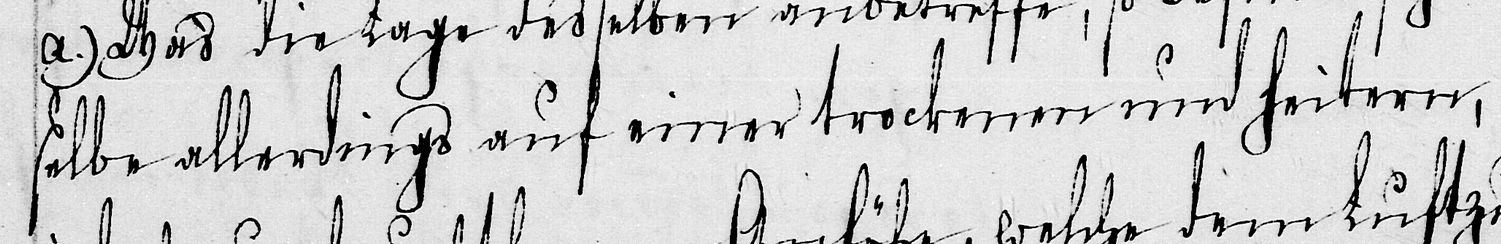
selbe allerdings auf einer trockenen und heitern,
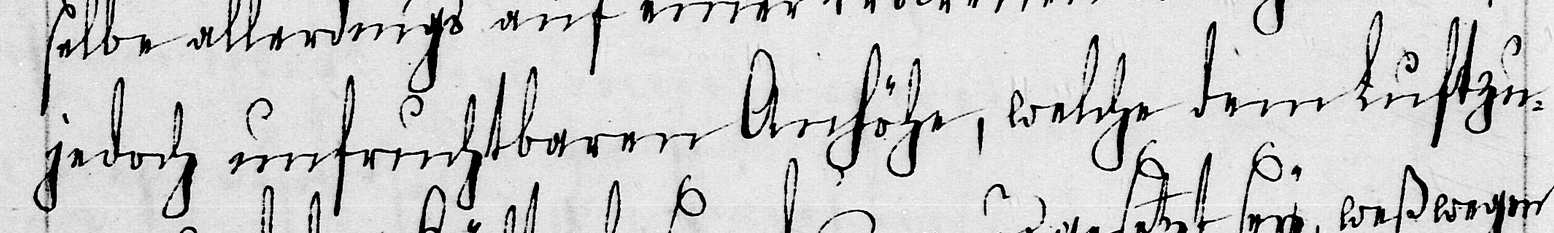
jedoch unfruchtbaren Anhöhe, welche dem Luftzu¬
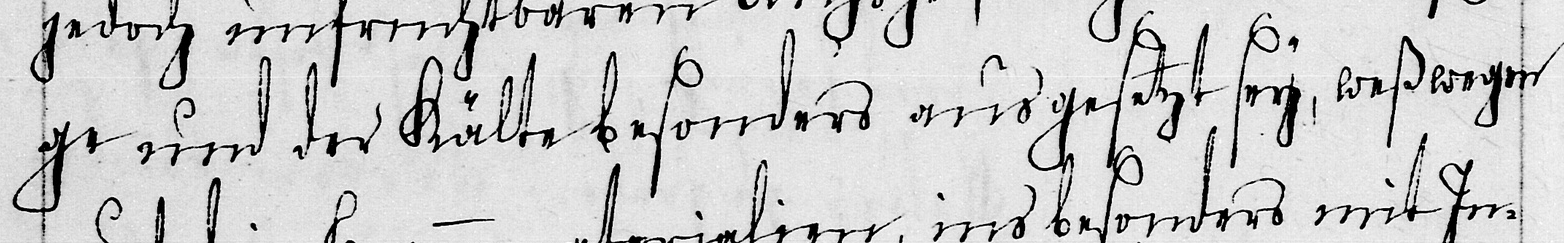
ge und der Kälte besonders ausgesetzt sey, weßwegen
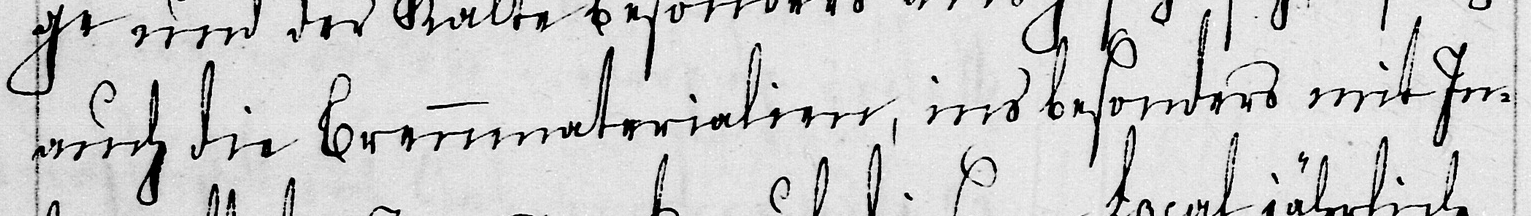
auch die Brennmaterialien, insbesonders mit In¬
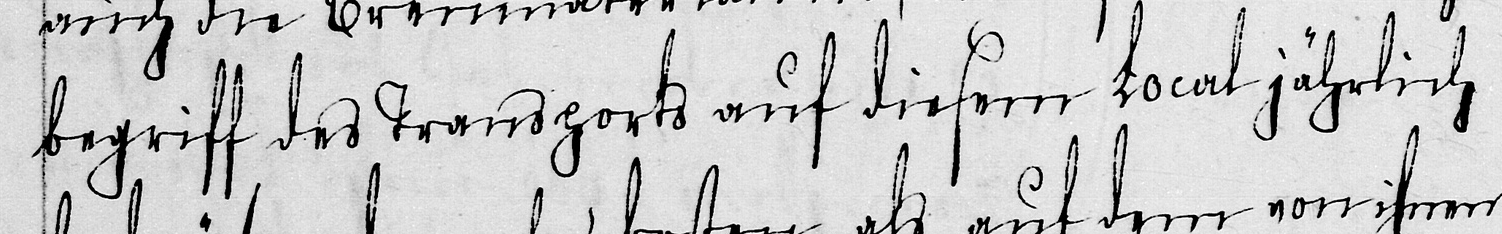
begriff des Transports auf diesem Local jährlich
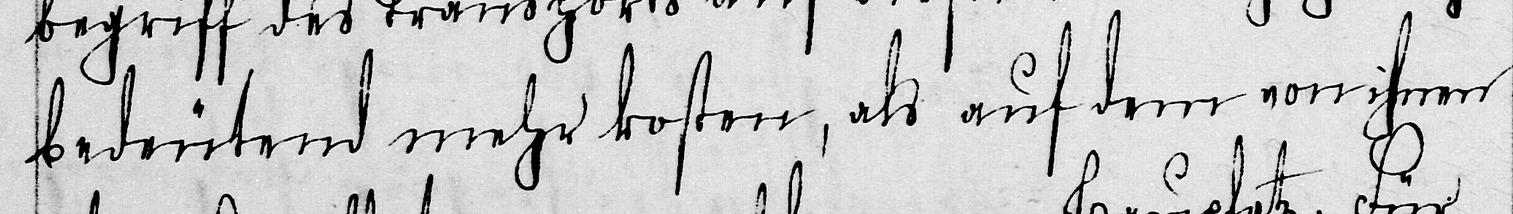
bedeutend mehr kosten, als auf dem von ihnen
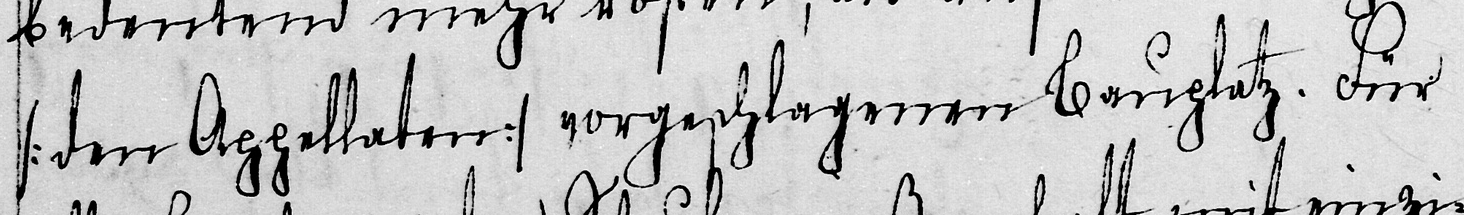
[den Appellaten] vorgeschlagenen Bauplatz. Für
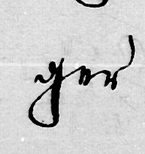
der¬
